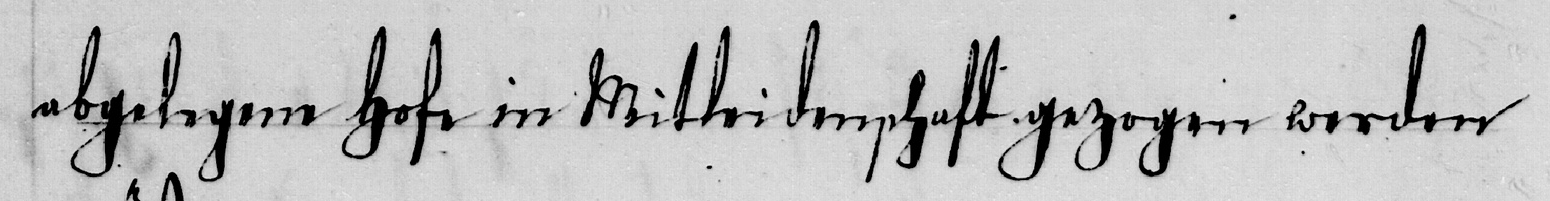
abgelegene Hofe in Mitleidenschaft gezogen werden
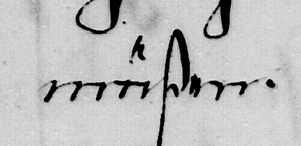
müßen.
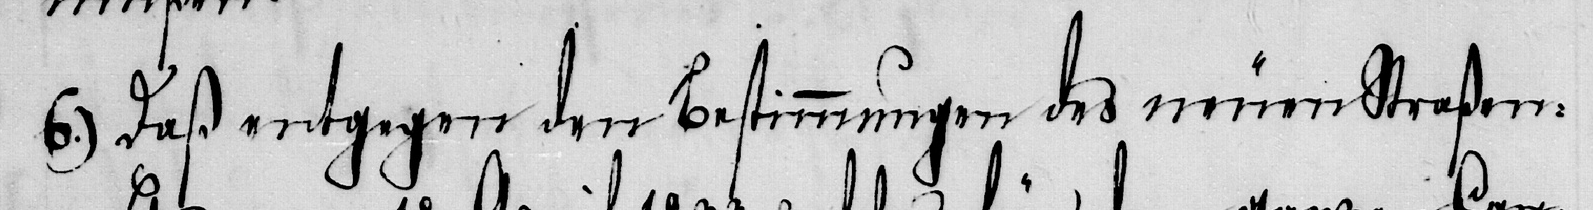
6.) Daß entgegen den Bestimmungen des neuen Straßen¬
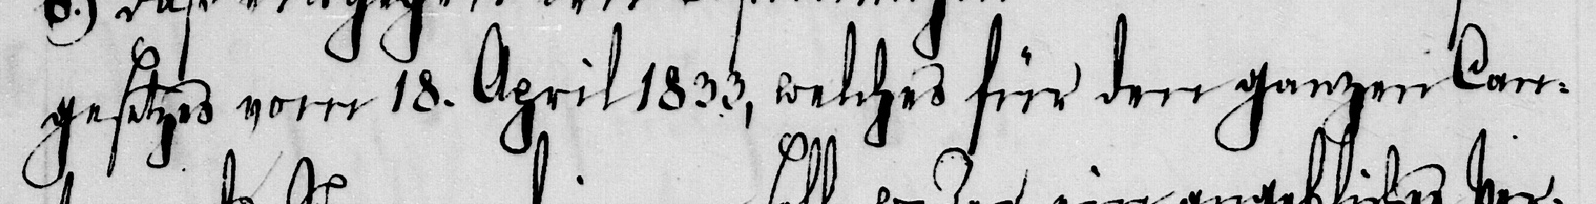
gesetzes vom 18. April 1833, welches für den ganzen Can¬
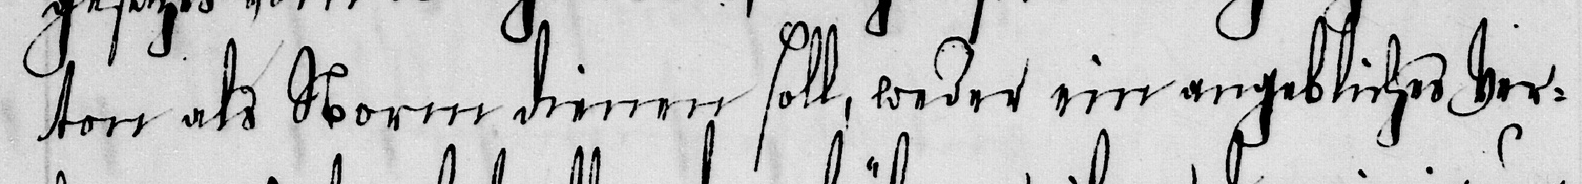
ton als Norm dienen soll, weder ein angebliches Vor¬
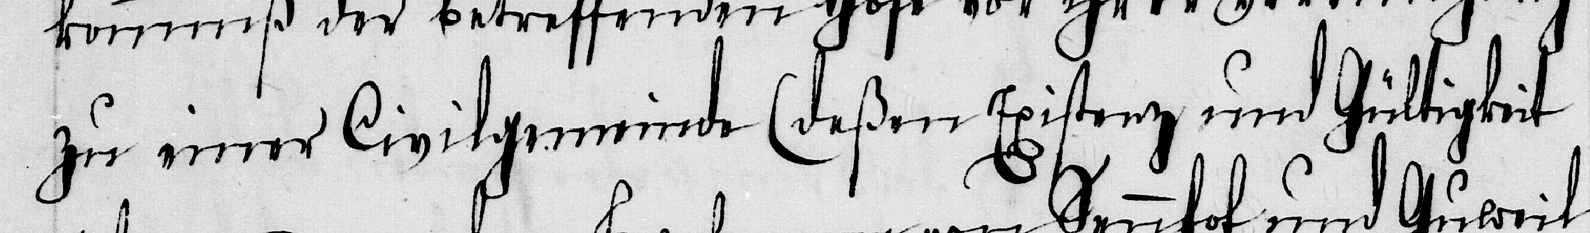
zu einer Civilgemeinde (deßen Existenz und Gültigkeit
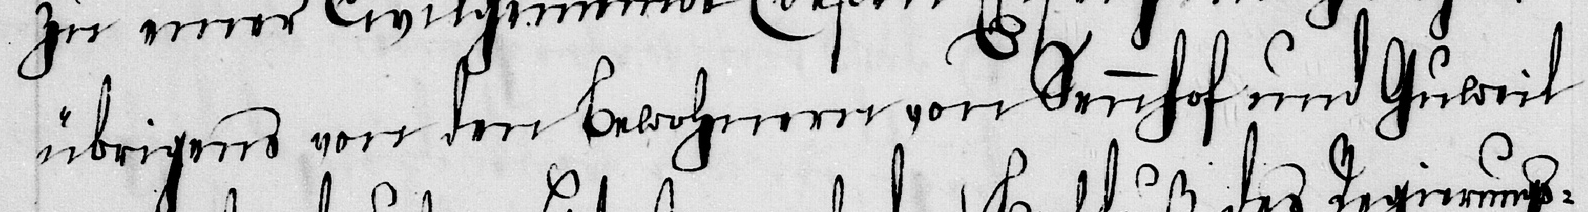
übrigens von den Bewohnern von Sennhof und Guweil
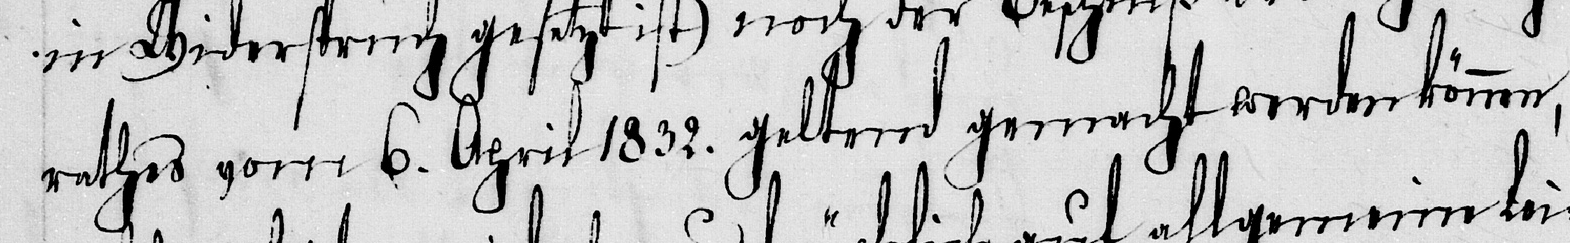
rathes vom 6. April 1832. geltend gemacht werden können,
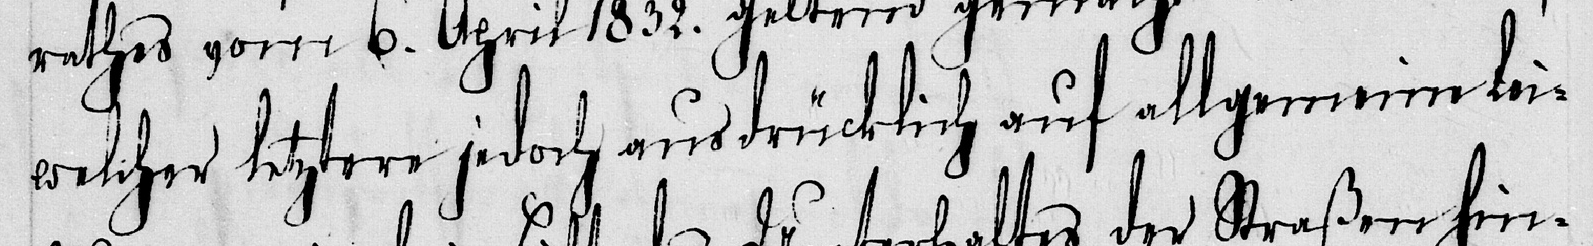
welcher letztere jedoch ausdrücklich auf allgemeine Lei¬
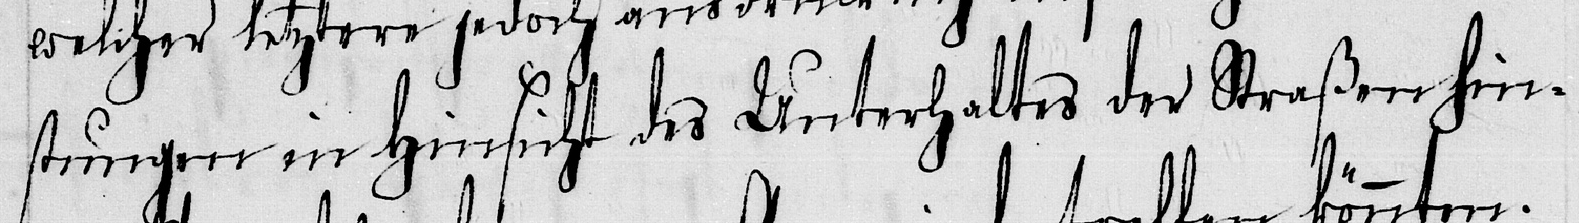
stungen in Hinsicht des Unterhaltes der Straßen hin¬
